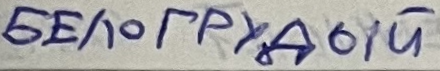белогрудый
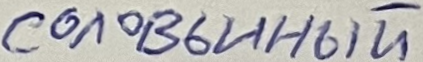соловьиный
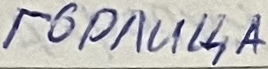горлица
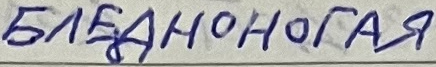бледноногая
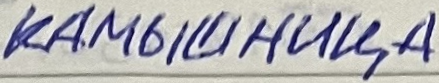камышница
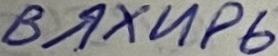вяхирь
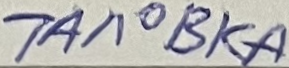таловка
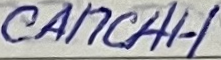сапсан
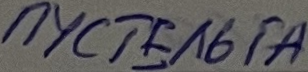пустельга
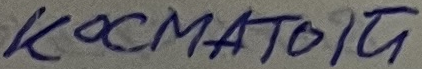косматый
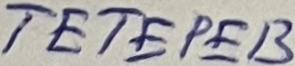тетерев
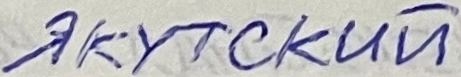якутский
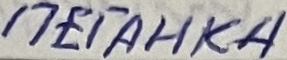пеганка
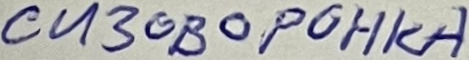сизоворонка
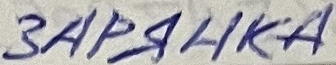зарянка
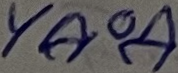удод
